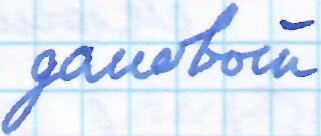домовый
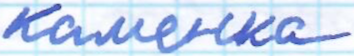каменка
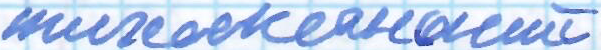тихоокеанский
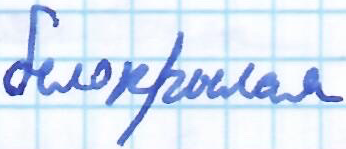белокрылая
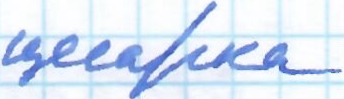цесарка
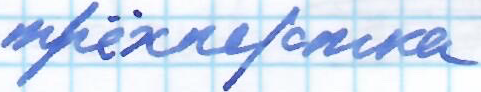трёхперстка
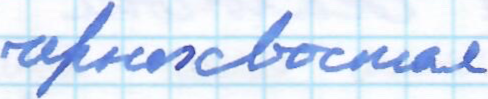чернохвостая
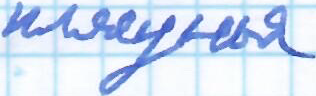плясунья
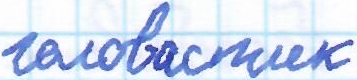головастик
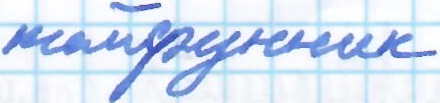тайфунник
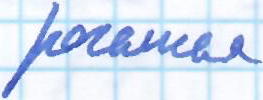рогатая
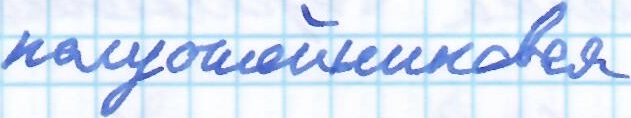полуошейниковая
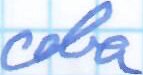сова
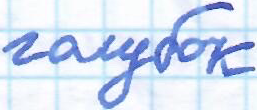голубок
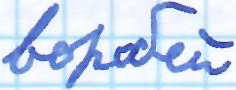воробей
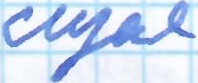сизая
